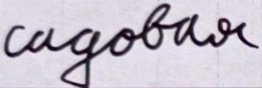садовая
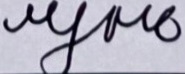лунь
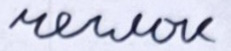чеглок
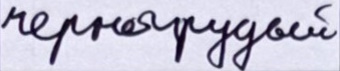черногрудый
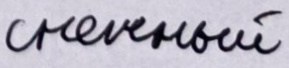снежный
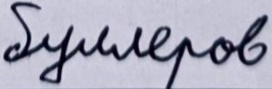буллеров
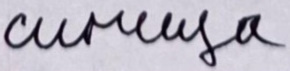синица
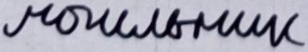могильник
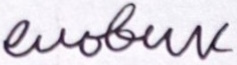еловик
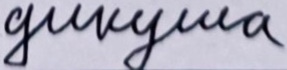дикуша
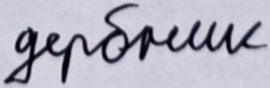дербник
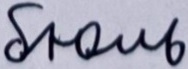бюль
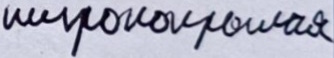ширококрылая
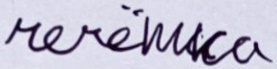чечётка
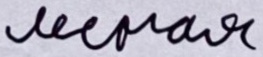лесная
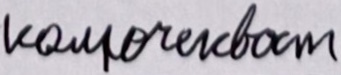колючехвост
